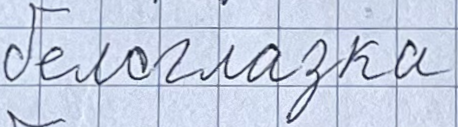белоглазка
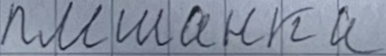плешанка
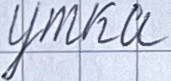утка
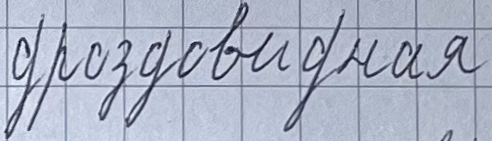дроздовидная
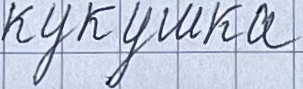кукушка
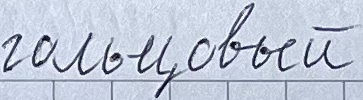гольцовый
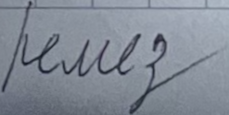ремез
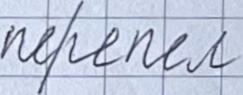перепел
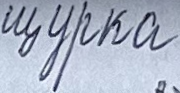щурка
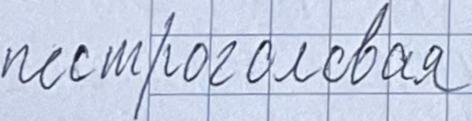пестроголовая
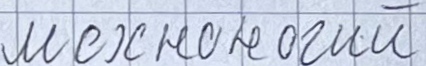мохноногий
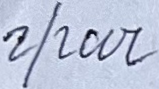грач
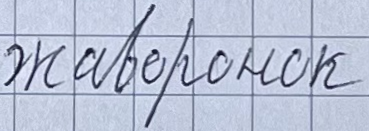жаворонок
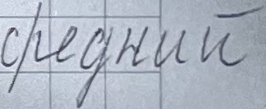средний
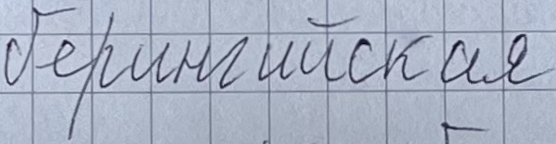берингийская
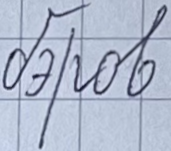бэров
